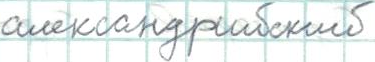александрийский
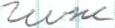чиж
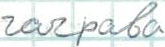чаграва
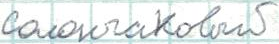солончаковый
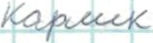карлик
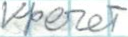кречет
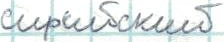сирийский
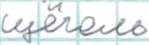щёгель
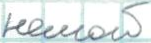немой
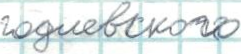годлевского
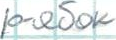рябок
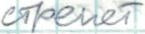стрепет
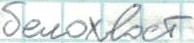белохвост
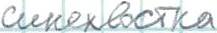синехвостка
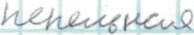пепельная
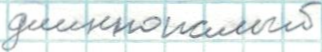длиннопалый
